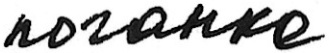поганка
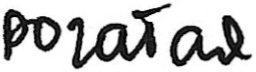рогатая
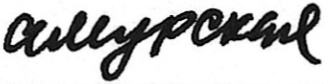амурская
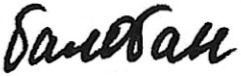балобан
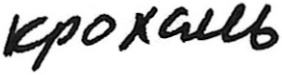крохаль
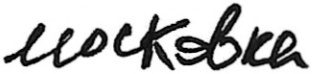московка
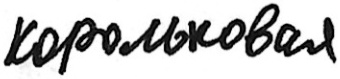корольковая
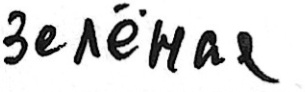зелёная
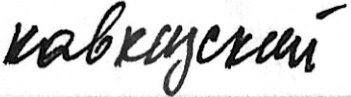кавказский
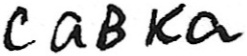савка
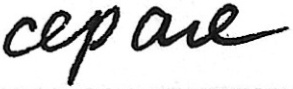серая
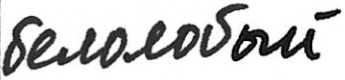белолобый
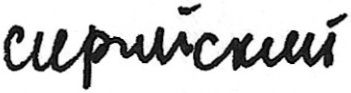сирийский
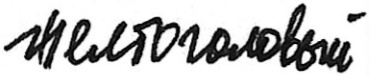желтоголовый
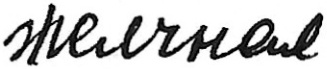желчная
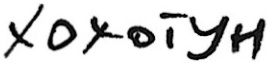хохотун
